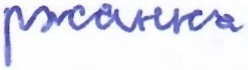ржанка
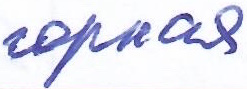горная
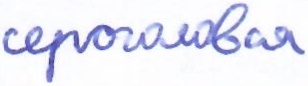сероголовая
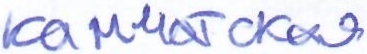камчатская
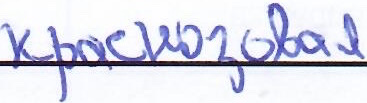краснозовая
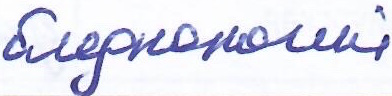бледноногий
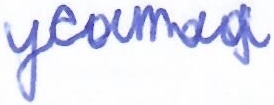усатая
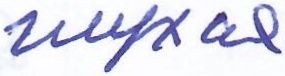глухая
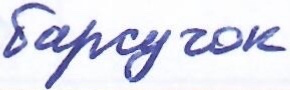барсучок
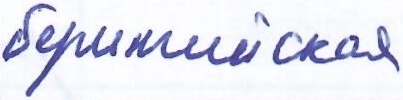берингийская
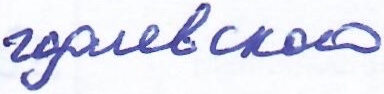гдолевского
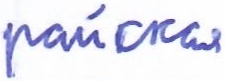райская
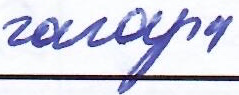гагара
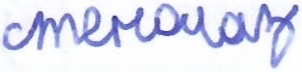стенолаз
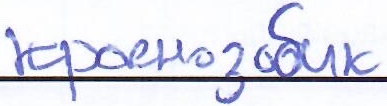краснозобик
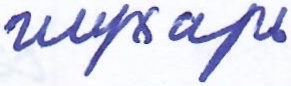глухарь
